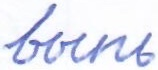выпь
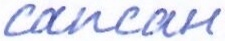сапсан
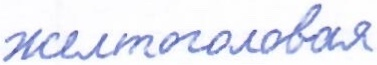желтоголовая
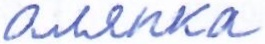оляпка
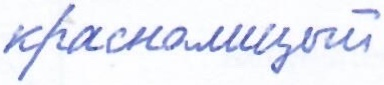краснолицый
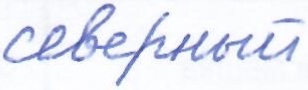северный
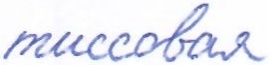тиссовая
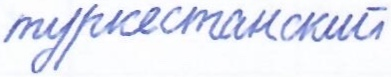туркестанский
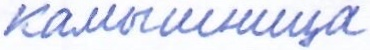камышница
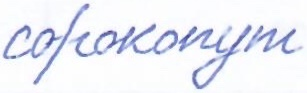сорокопут
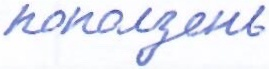поползень
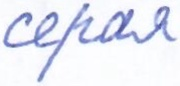серая
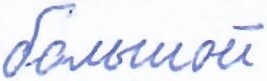большой
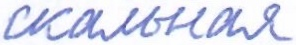скальная
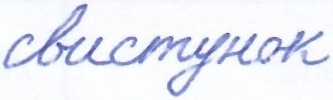свистунок
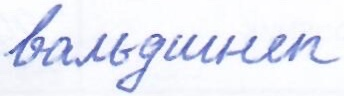вальдшнеп
